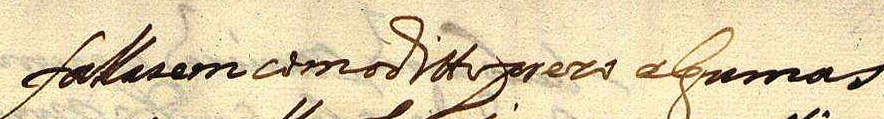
fallarem com o ditto prezo algumas
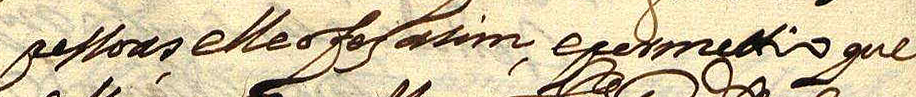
pessoas, elle o fes asim, e permettio que
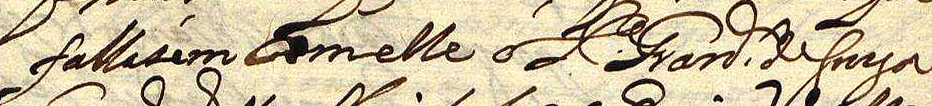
fallasem com elle o P.e Fran.co de souza
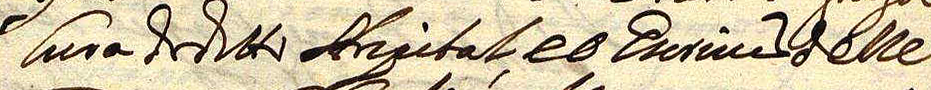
Cura do ditto Hospital, e o Escriuaõ delle
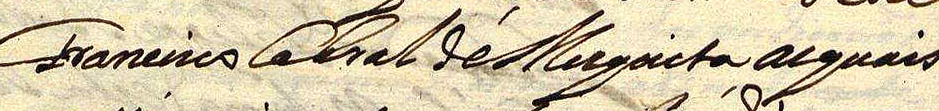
Francisco Cabral de Mesquita, as quais
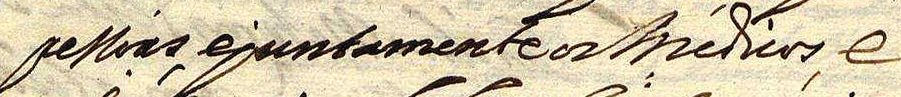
pessoas, e juntamente os Medicos, e
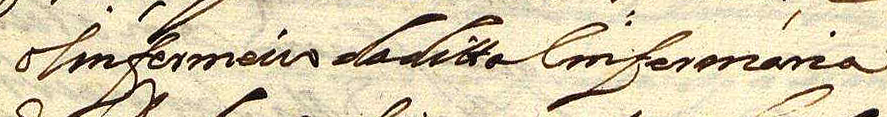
o Imfermeiro da ditta Imfermaria
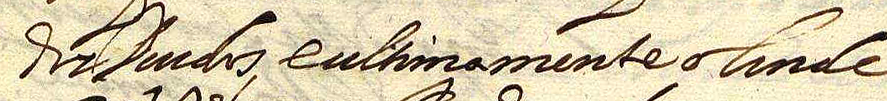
doz Doudos, e ultimamente olinde
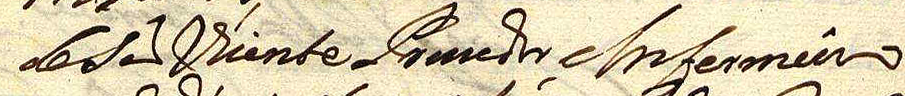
de Saõ Vicente Prouedor, e Infermeiro
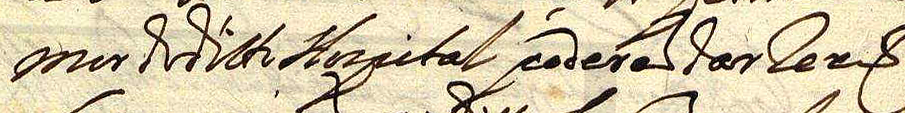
mor do ditto Hospital poderaõ dar Rezaõ
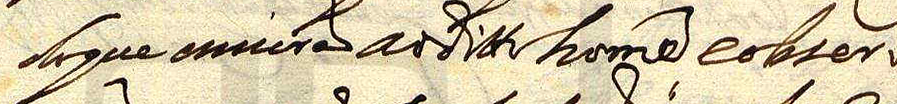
do que ouuiraõ ao ditto homē, e obser
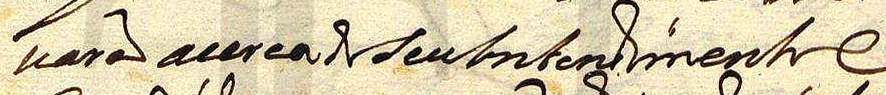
uaraõ acerca do seu entendimento, e
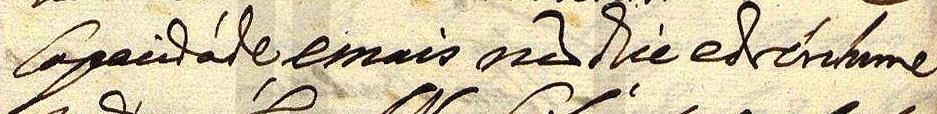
Capacidade, e mais naõ dice, e do costume
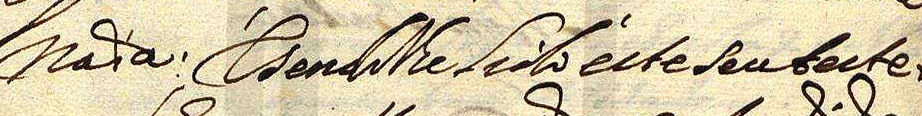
nada; E sendolhe lido este seu teste
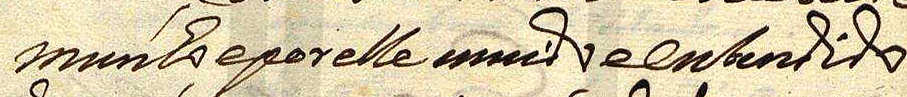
munho, e por elle ouuido, e entendido
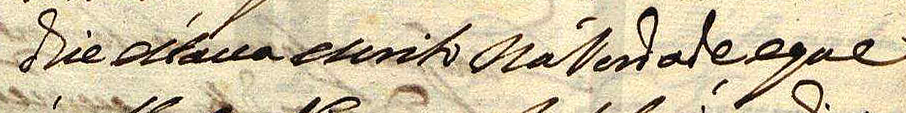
dice estaua escrito na verdade, e que
